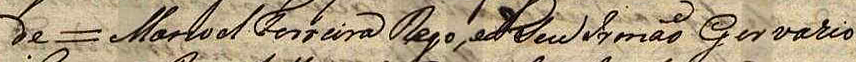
de = Manoel Ferreira Rego, e seu Irmaõ Gervazio
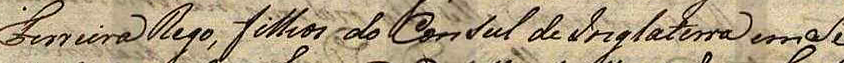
Ferreira Rego, filhos do Consul de Inglaterra em Se
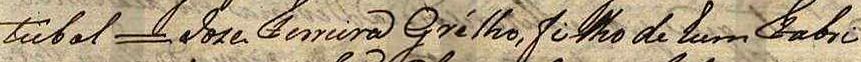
tubal = Joze Ferreira Grélho, filho de hum Fabri
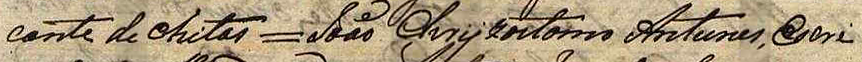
cante de chitas = João Chrisostomo Antunes, Escri
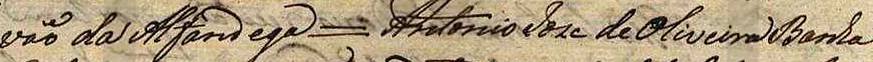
vaõ da Alfandega = Antonio Joze de Oliveira Banha
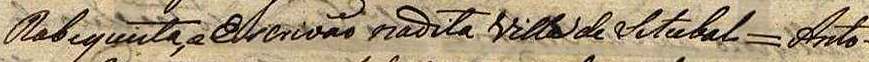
Rabequista, e Escrivão na dita Villa de Setubal = Anto
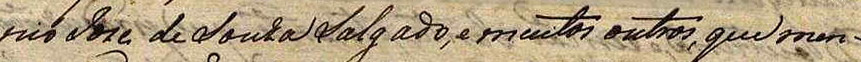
nio Joze de Souza Salgado, e muitos outros, que men
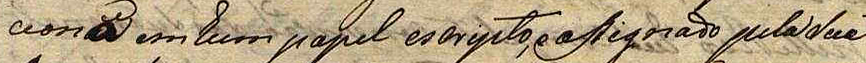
ciona em hum papel escripto, e assignado pela sua
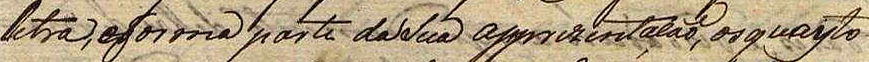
letra, e forma parte da sua apprezentaçaõ, os quais to
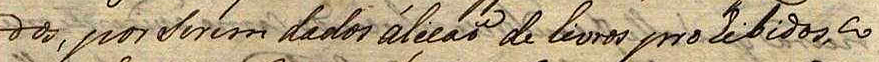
dos, por serem dados á liçaõ de livros prohibidos, co
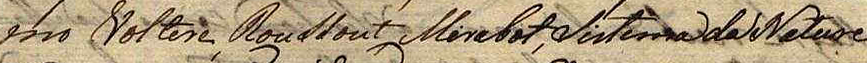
mo Voltere, Roussout, Mirabot, Sistema da Nature
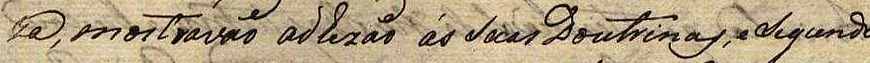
za, mostravaõ adhezaõ ás secas Doutrinas, e segundo
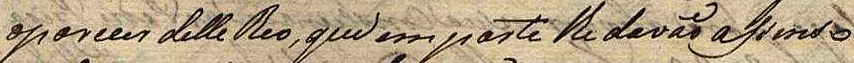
o parecer delle Reo, que em parte lhe davaõ assenso
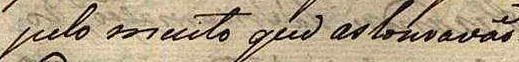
pelo muito que as louvavaõ.
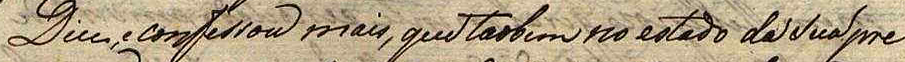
Dice, e confessou mais, que taobem no estado da sua pre
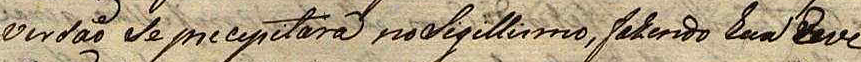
versaõ se precepitara no Sigillismo, fazendo hua Reve
